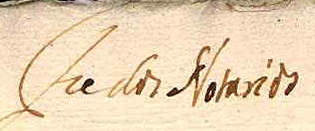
Fee dos Notarios
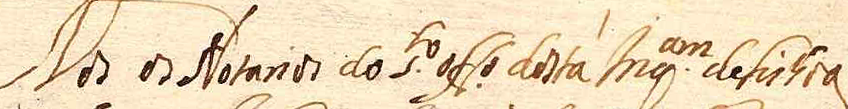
Nos os Notarios do s.to off.o desta Inq.am de Lisboa
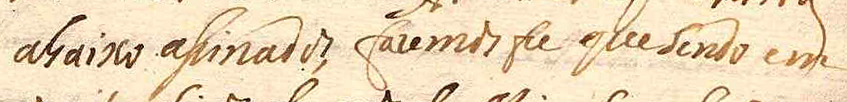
abaixo assinados, fazemos fee que sendo em
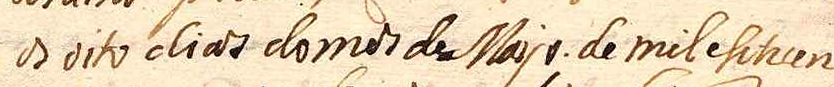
os oito dias do mes de Mayo de mil e setecen
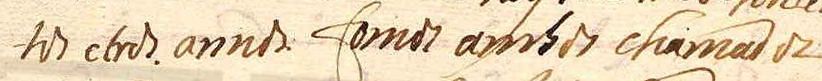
tos e tres annos fomos ambos chamados
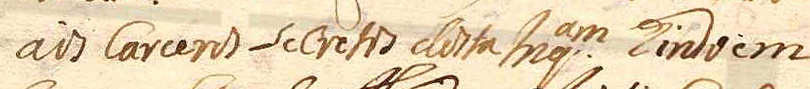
aos carceres secretos desta Inqam. hindo em
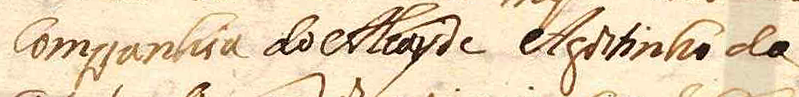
companhia do Alcayde Agostinho da
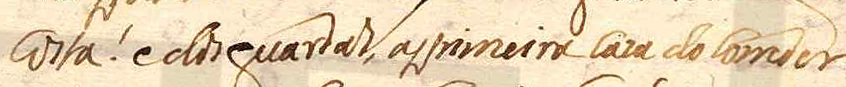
Costa e dos guardas, a primeira caza do corredor
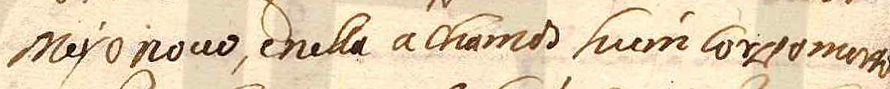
meyo nouo, e nella achamos hum corpo morto
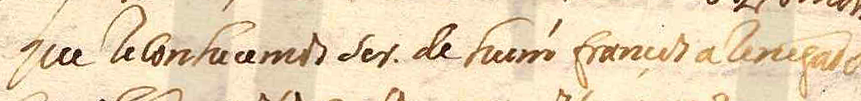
que Reconhecemos ser de hum françes aRenegado
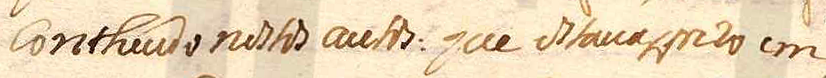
contheudo nestes autos: que estaua prezo em
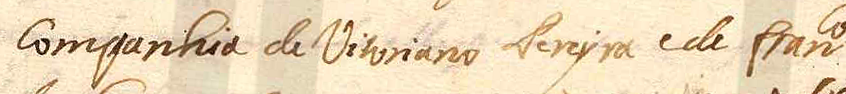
companhia de Vitoriano Pereyra e de franco.
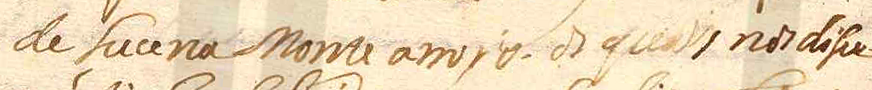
de Lucena Monte arroyo. os quaes nos disse
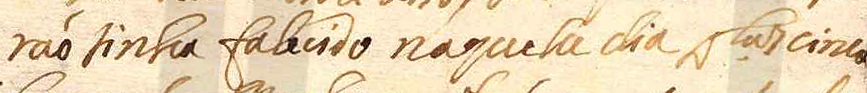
raõ tinha falecido naquelle dia p.las cinco
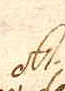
o R.
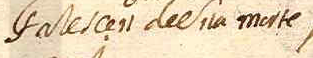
Falesceu de Sua morte
